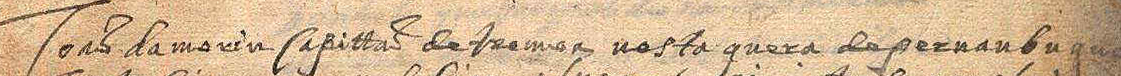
Joaõ damorin Capittaõ de tremoa nesta guera de pernaubuquo
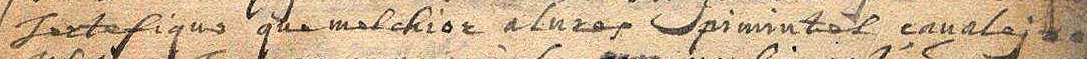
sertefiquo que melchior alures pimintel caualejro
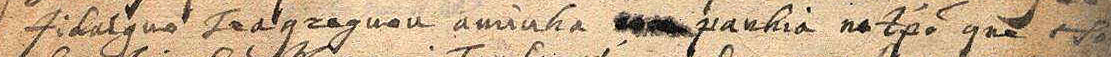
fidalguo se agreguou a minha _panhia no tpō que
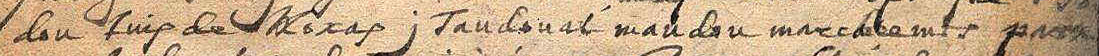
dou Luis de Roxas j sandoual mandou mareacemos para
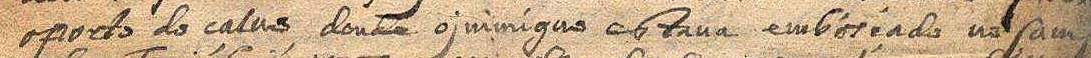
o porto do caluo donde o jnimiguo estaua emboscado no Camj
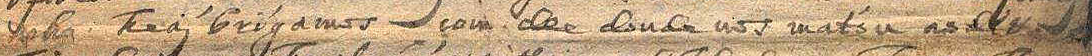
nho he aj brigamos com elle donde nos matou ao ditto
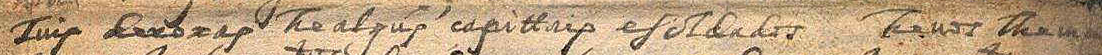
Luis de roxas he algūs capittais e soldados he nos lhe ma
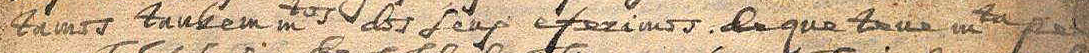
tamos tanbem mtos dos seus e ferimos de que teue mta pe
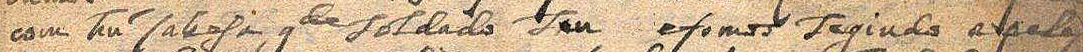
com hū Cabesa g.de soldado seu e fomos segindo a peleja
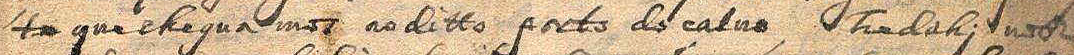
te que cheguamos ao ditto porto do caluo, he dahj nos
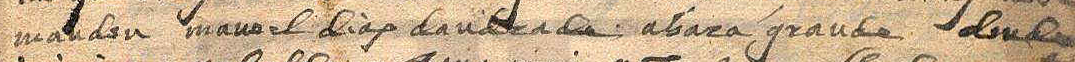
mandou manoel dias dandrada a caza grande donde
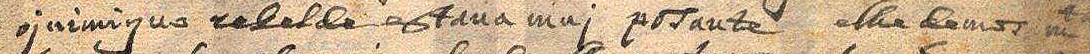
o jnimiguo rebelde estaua muj posante e lhe temos mtas
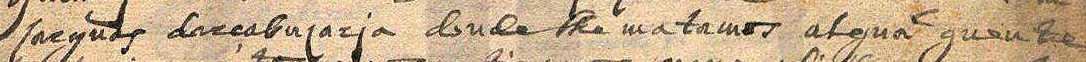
larguas darcabuzarja donde lhe matamos alguā gente
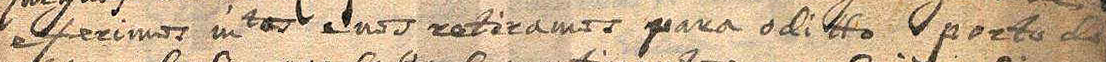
e ferimos mtos e nos retiramos para o ditto porto de
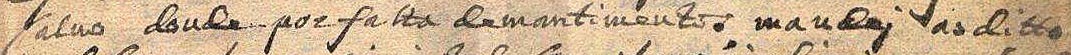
Caluo donde por falta de mantimentos mandej ao ditto
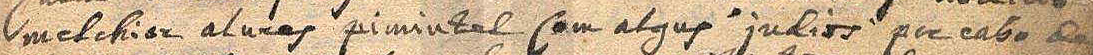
melchior alures pimintel Com algus̄ judios por cabo de
